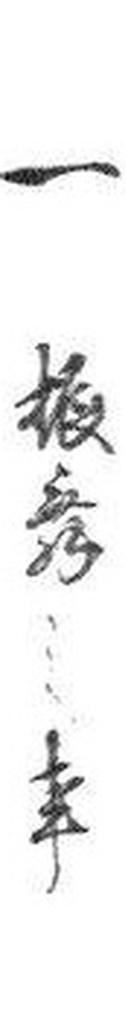一振舞之事
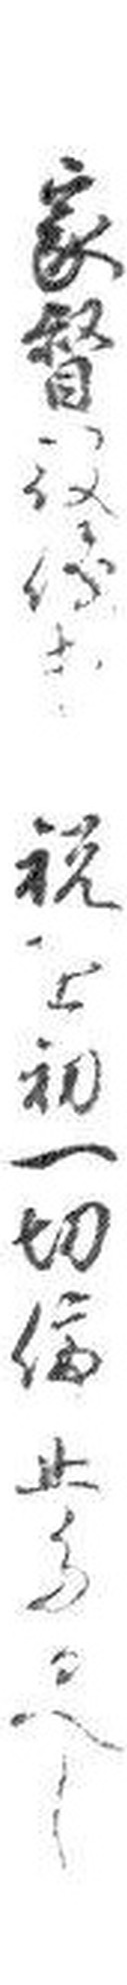家督役儀等祝を初一切停止たるへし
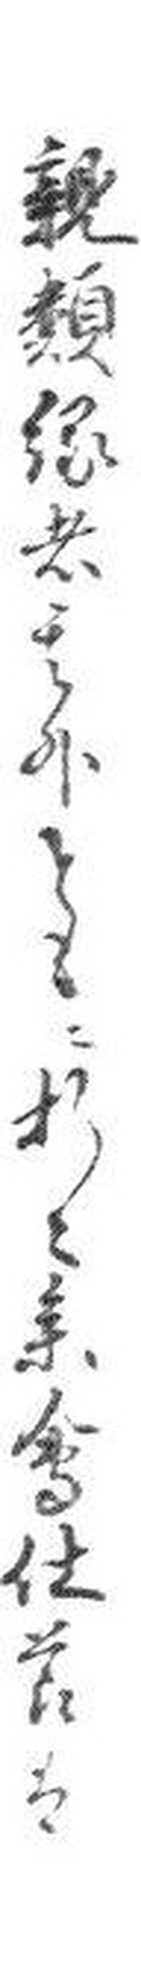親類縁者其外ともニ折々参会仕節は
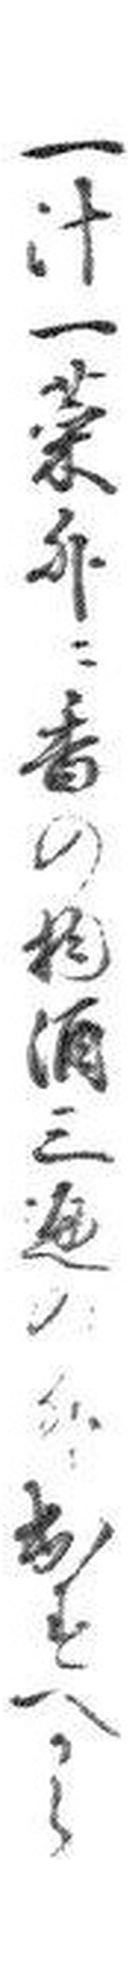一汁一菜外ニ香の物酒三通之外出すへから
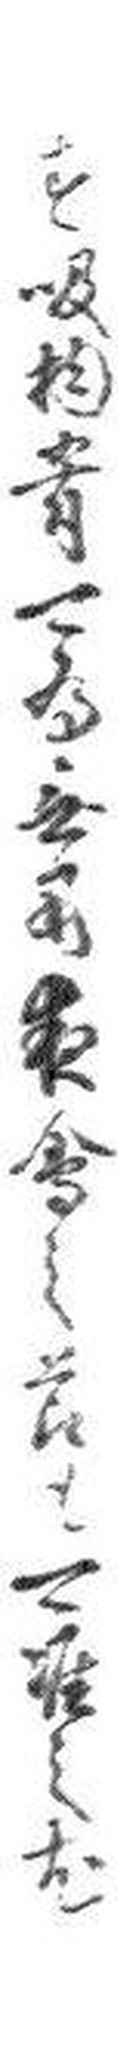す吸物肴可為無用夜会之節も可准之尤
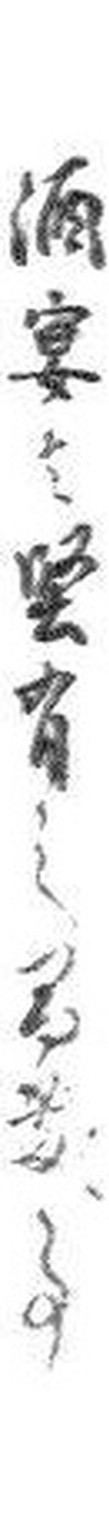酒宴者堅有之間敷事
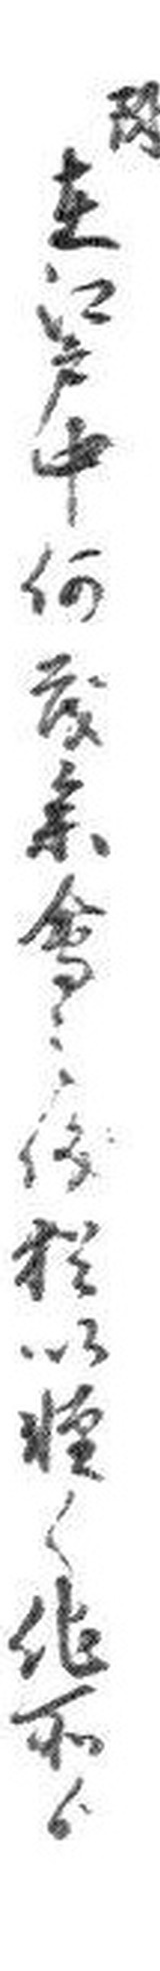在江戸中何茂参会之儀猶以軽く他所ゟ
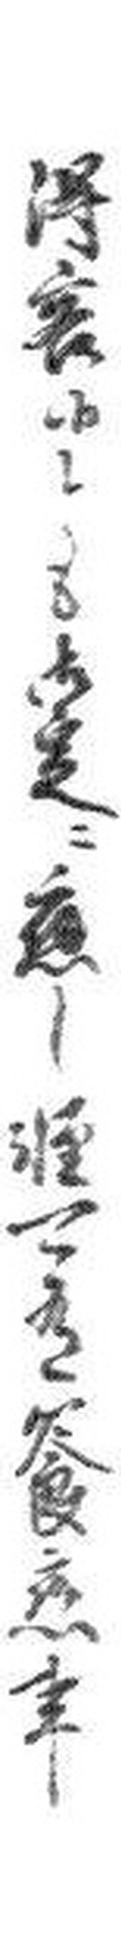得客候とも御定ニ応し軽可有饗応事
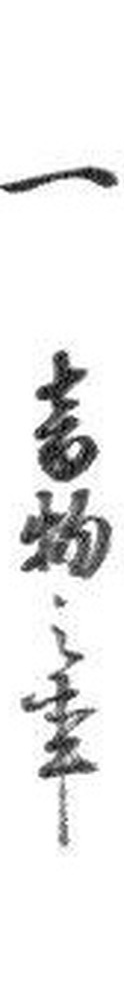一音物之事
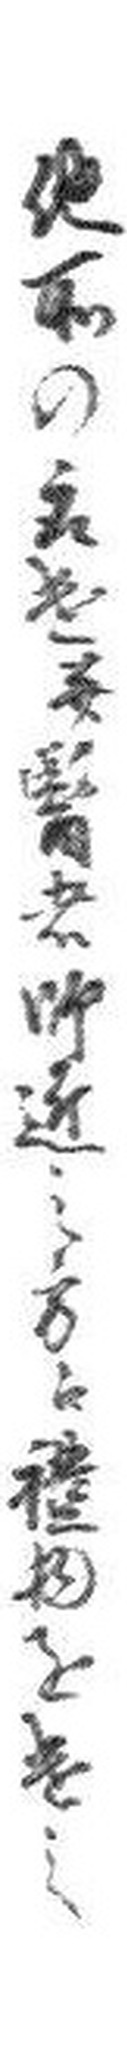他所の取遣并医者師匠之方江礼物を遣之
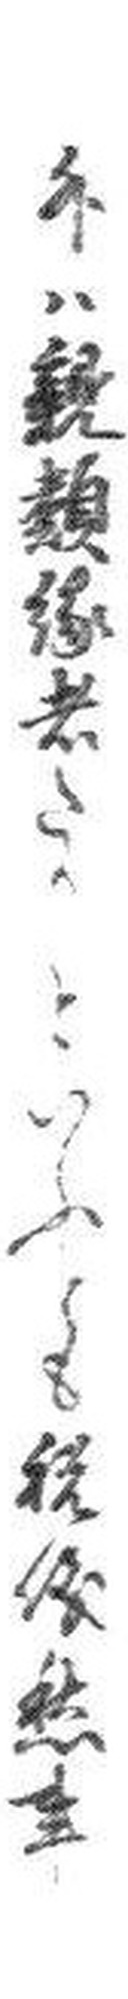外ハ親類縁者たりといふとも祝儀愁事
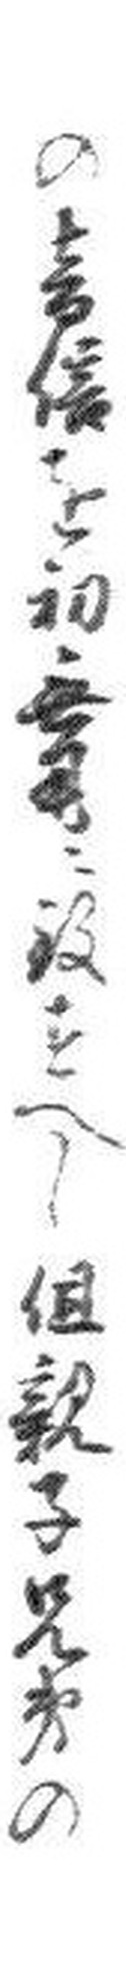之音信を初無用ニ致すへし但親子兄弟の

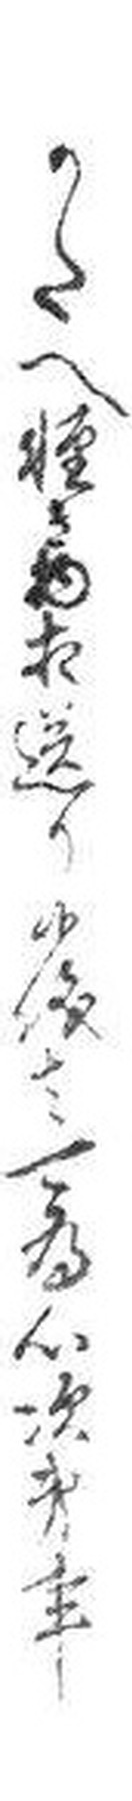かたへ軽き物相送り候儀者可為心次第事
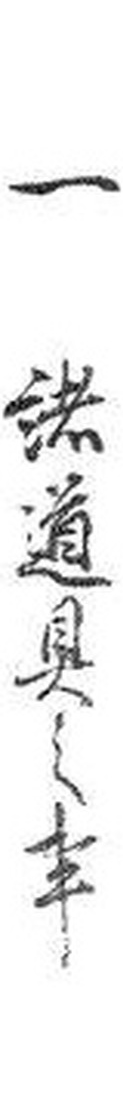一諸道具之事
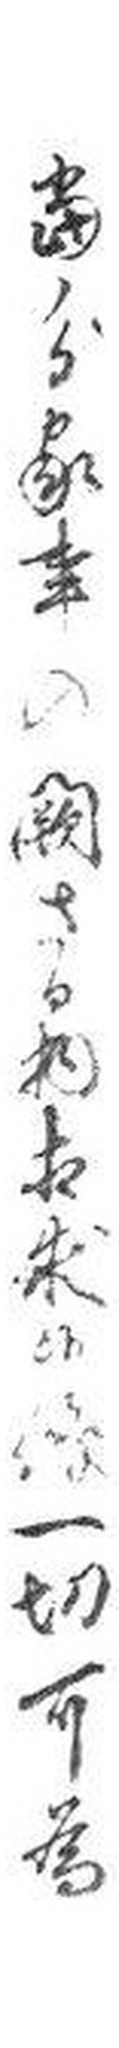当分家事の闕さる物相求候儀一切可為
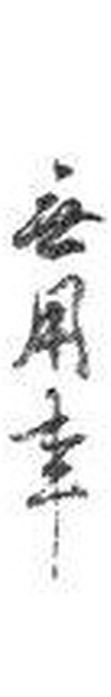無用事
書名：家譜 二十八 吉邦公 従宝永七年七月五日到正徳元年十二月
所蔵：福井県文書館 Fukui Prefectural Archives
